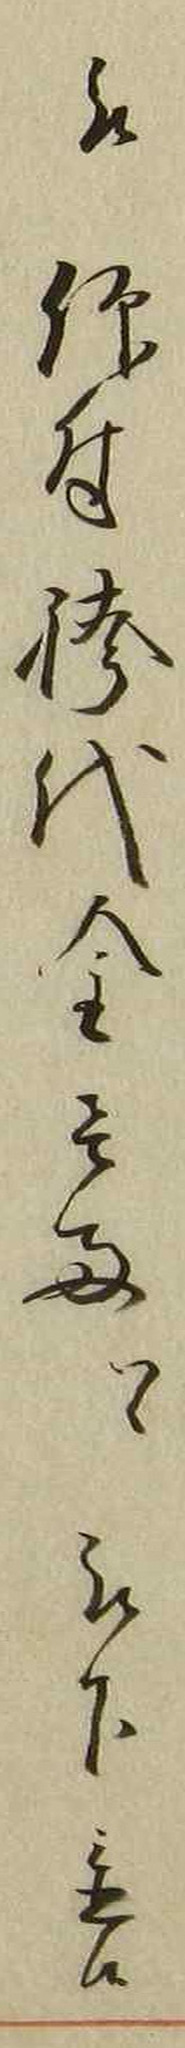被仰付袴代金壱両つゝ被下置候
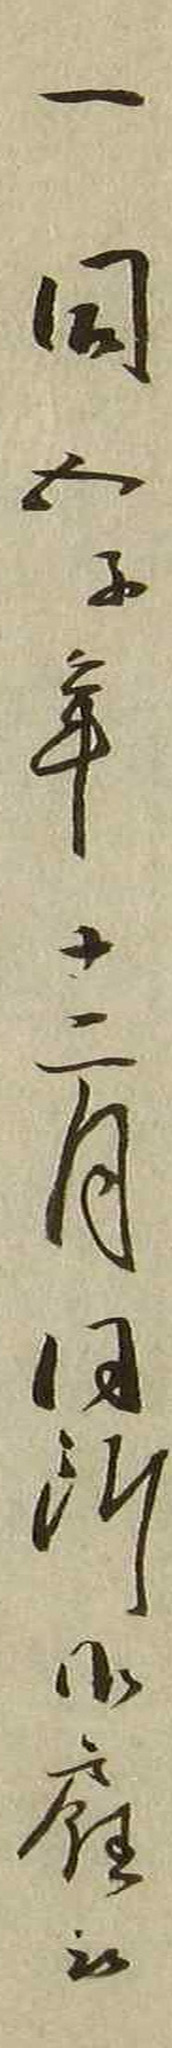一同五子年十二月同所御雇被
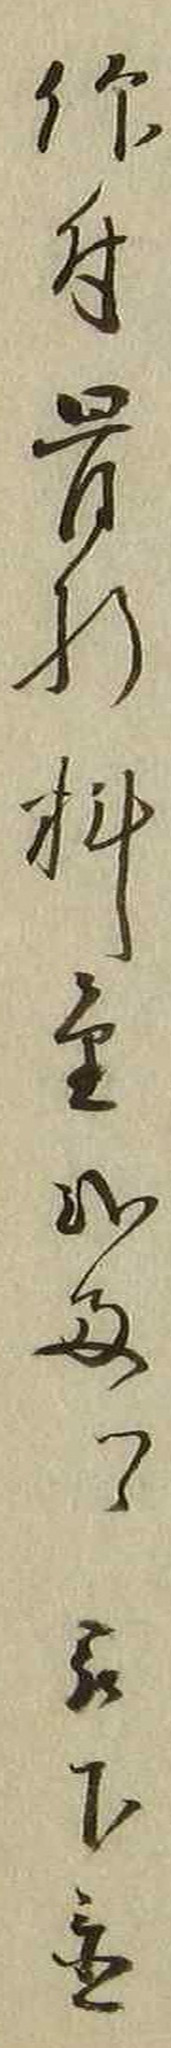仰付骨折料金弐両つゝ被下置
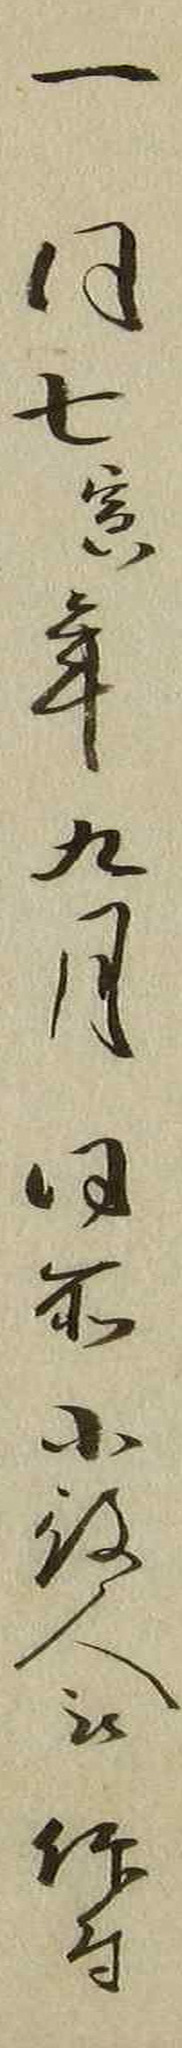一同七寅年九月同所小役人被仰付
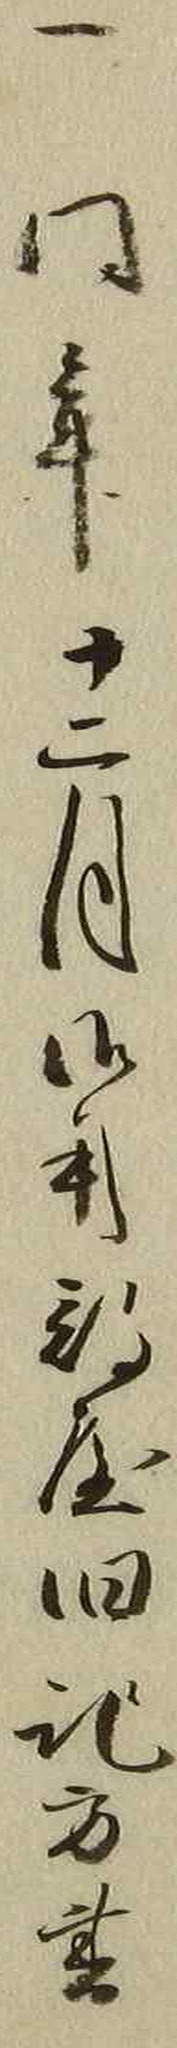一同年十二月御用部屋旧記方書
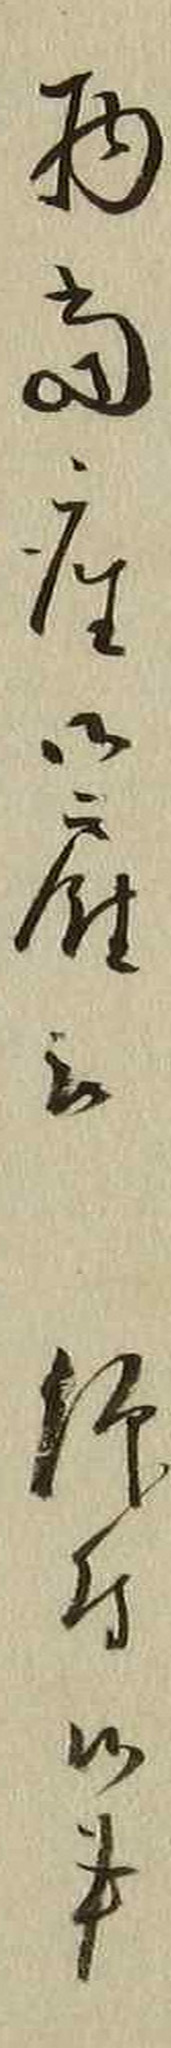物当座御雇被仰付候事
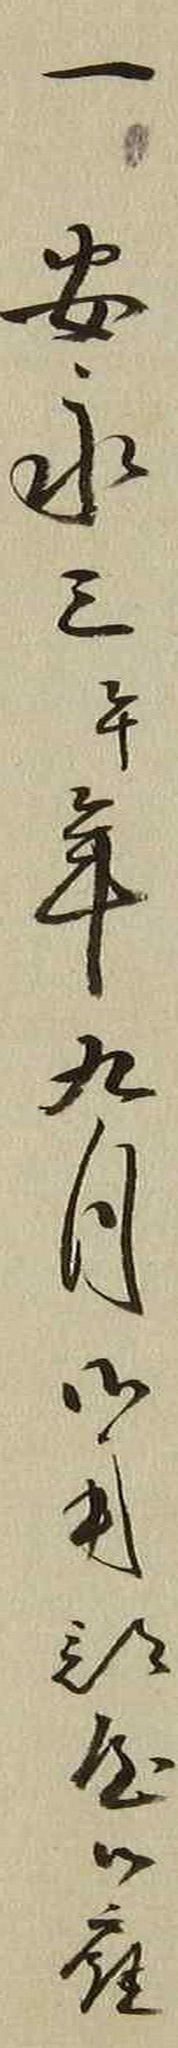一安永三午年九月御用部屋御雇
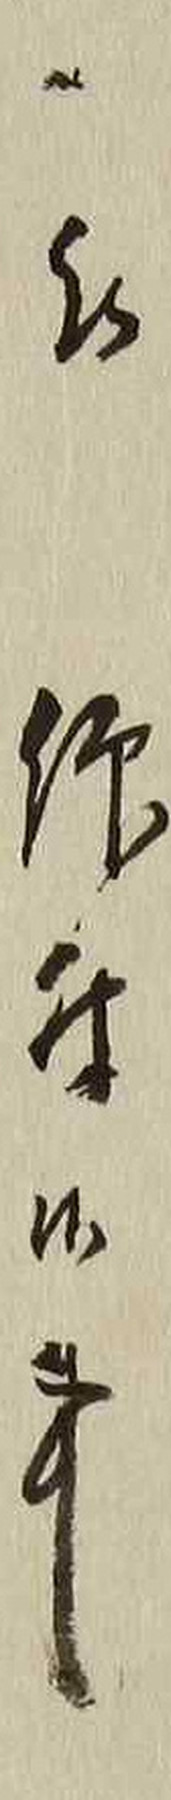被仰付候事
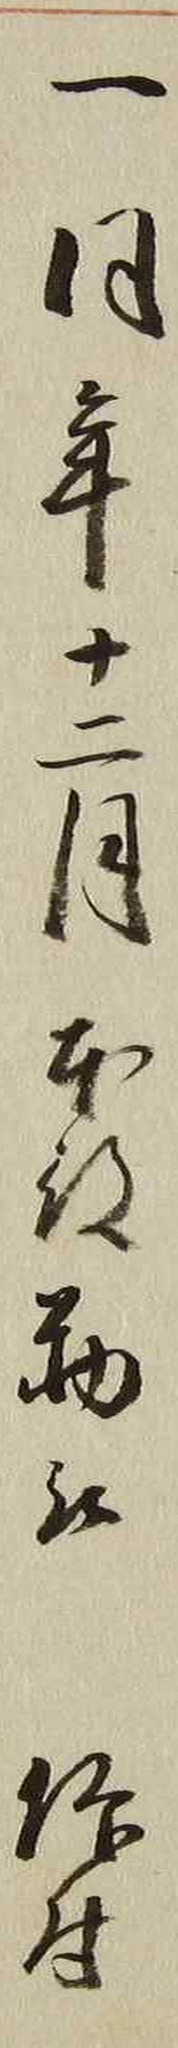一同年十二月本役勤被仰付
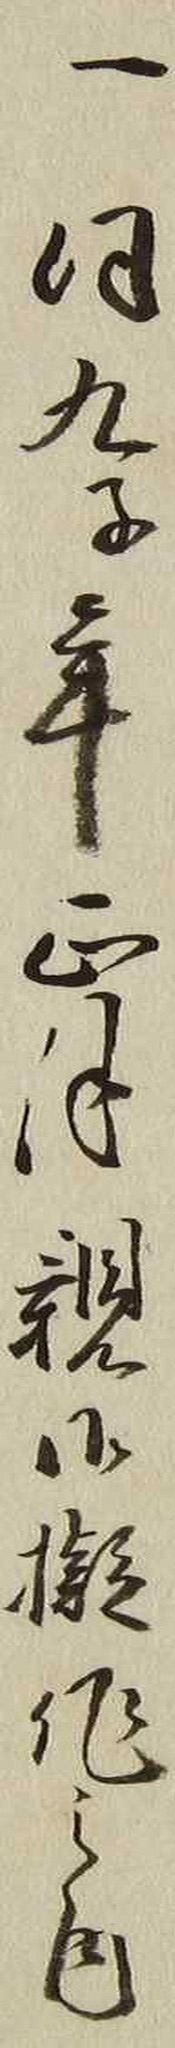一同九子年正月親御擬作之内
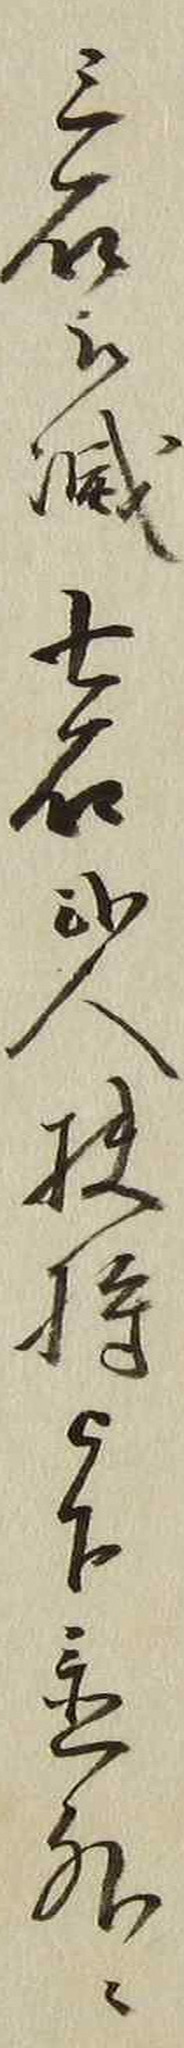三石被減七石弐人扶持被下置外ニ
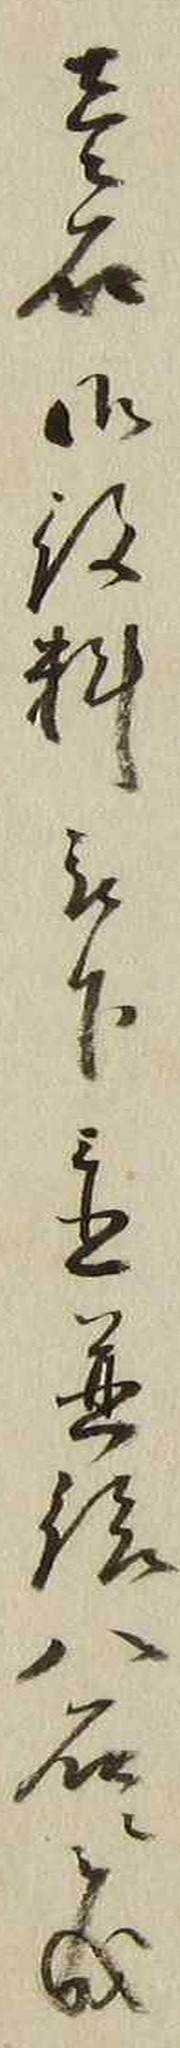壱石御役料被下置並拾八石ニ被成
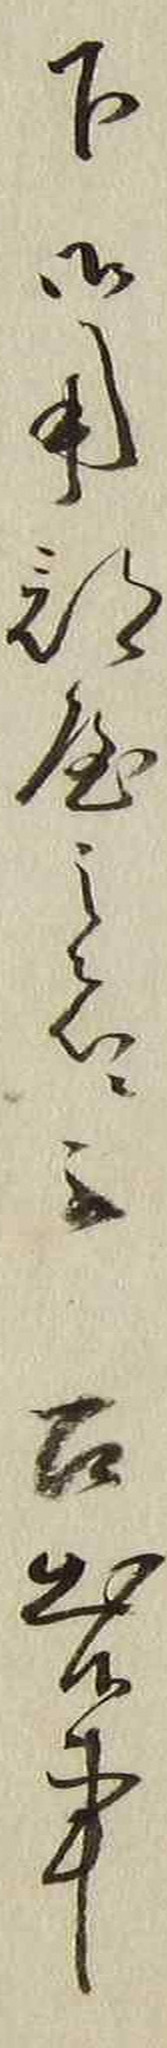下御用部屋之者ニ被召出候事
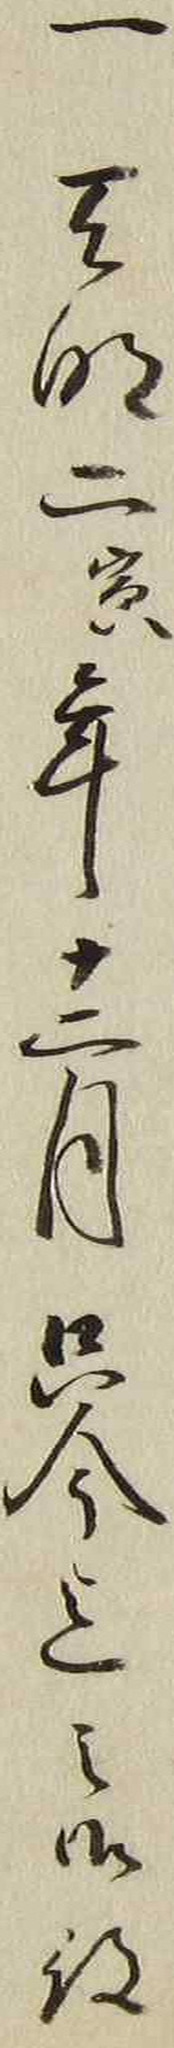一天明二寅年十二月只今迄之御役
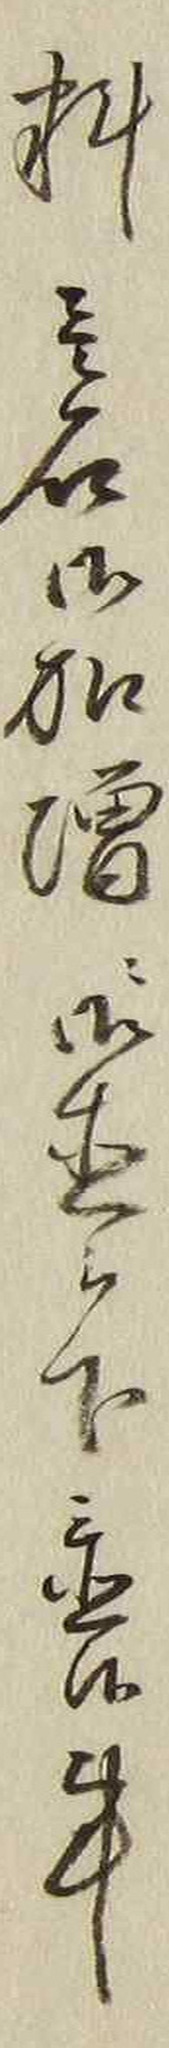料壱石御加増ニ御直被下置候事
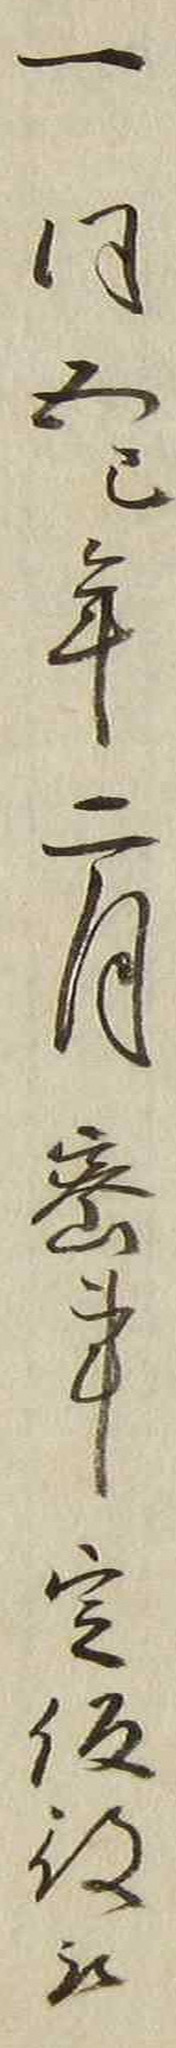一同五巳年二月密事定仮役被
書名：諸士系譜　巻之32　い之部32
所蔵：会津若松市立会津図書館
